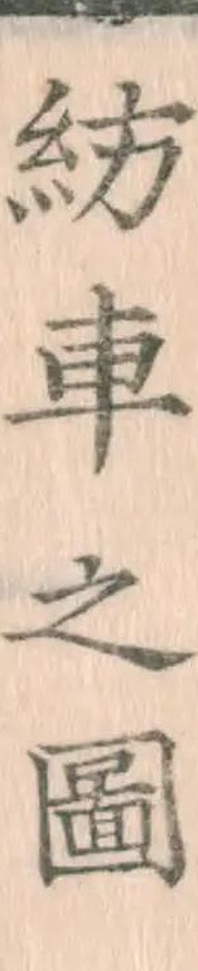紡車の図
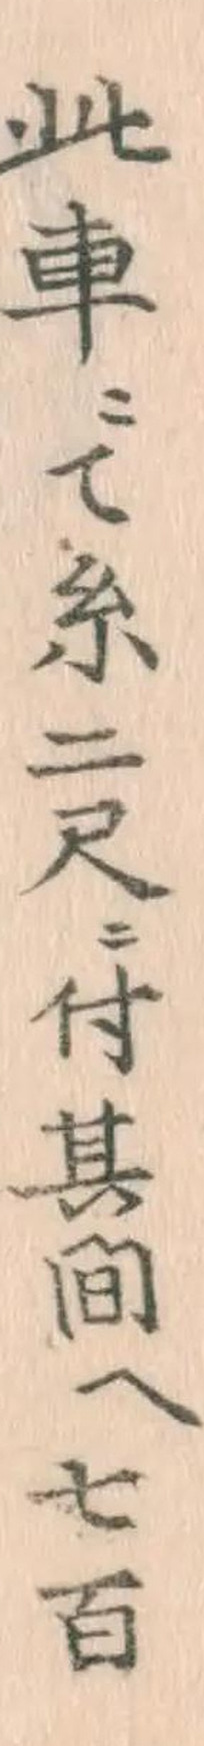此車にて糸二尺に付其間へ七百
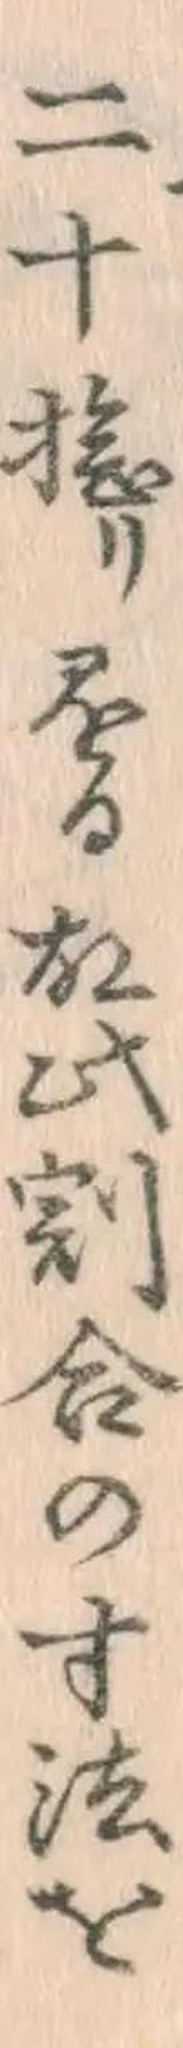二十捻り懸る故此割合の寸法を
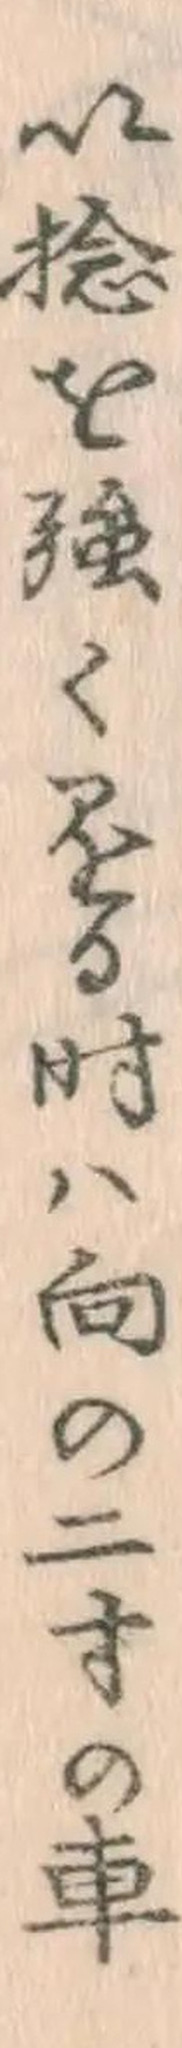以捻を強く懸る時は向の二寸の車
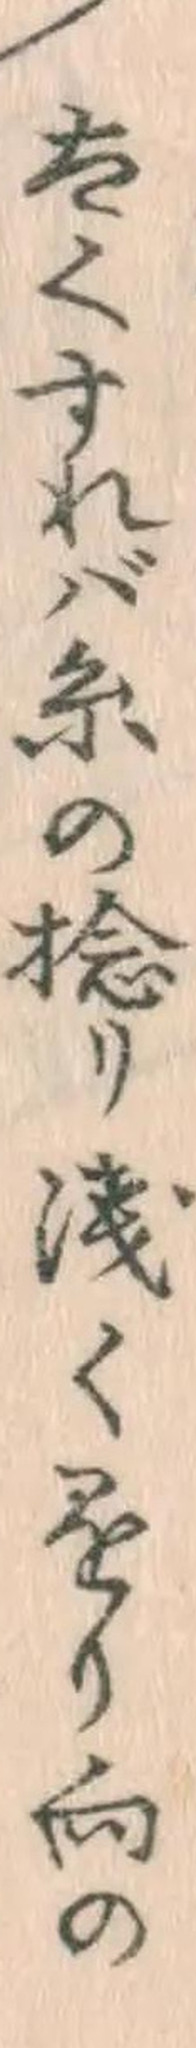太くすれば糸の捻り浅く懸り向の
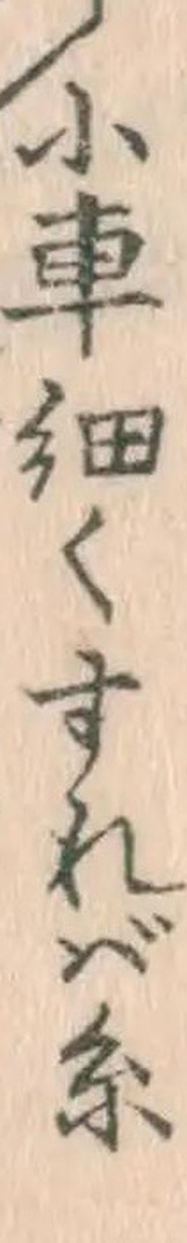小車細くすれば糸
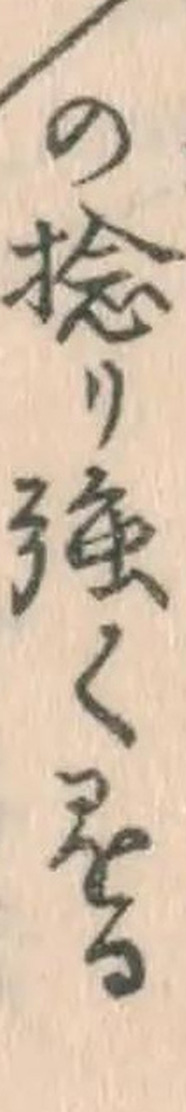の捻り強く懸る
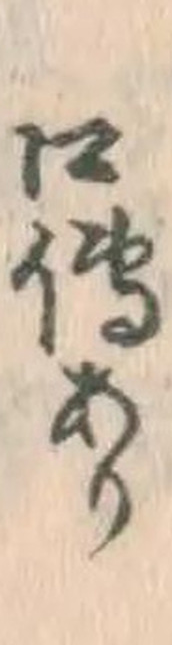口伝あり
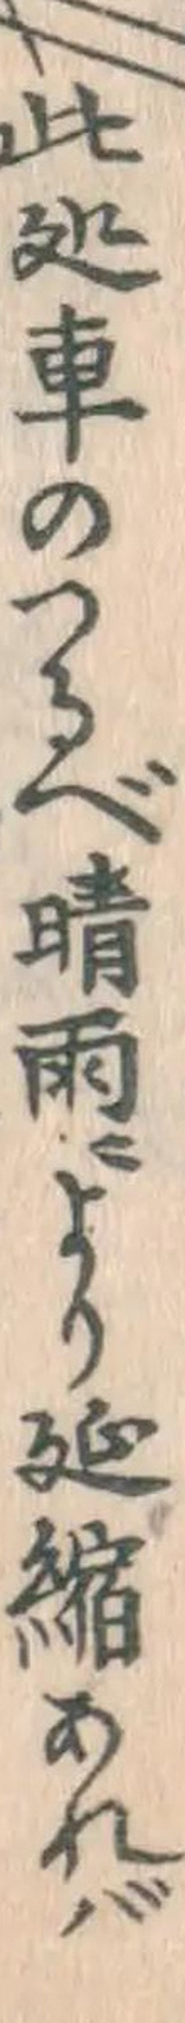此処車のつるべ晴雨により延縮あれば
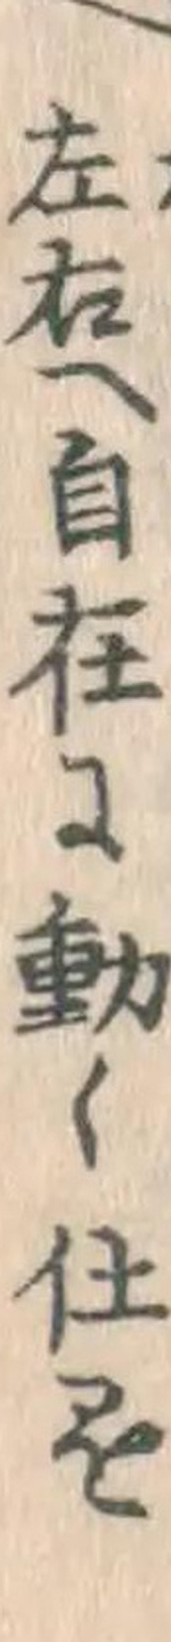左右へ自在に動く仕懸

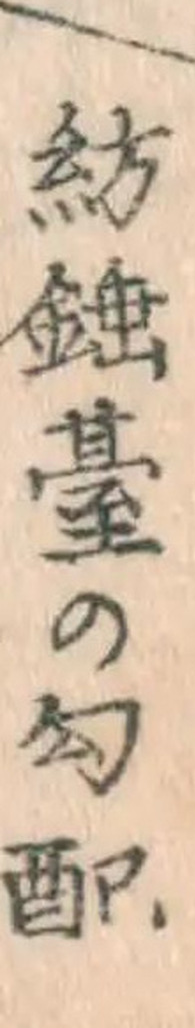紡錘台の勾配
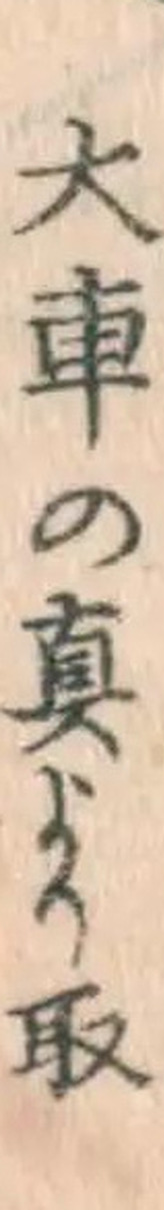大車の真より取
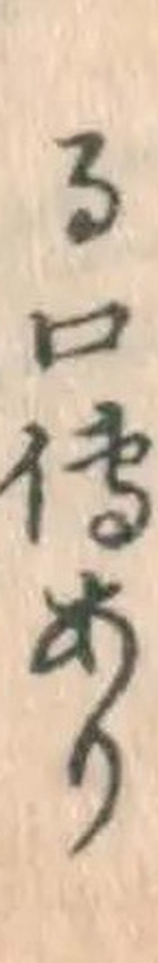る口伝あり
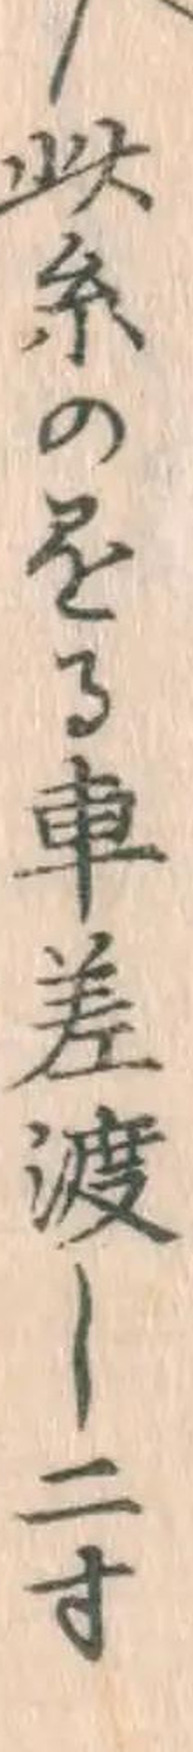此糸の懸る車差渡し二寸
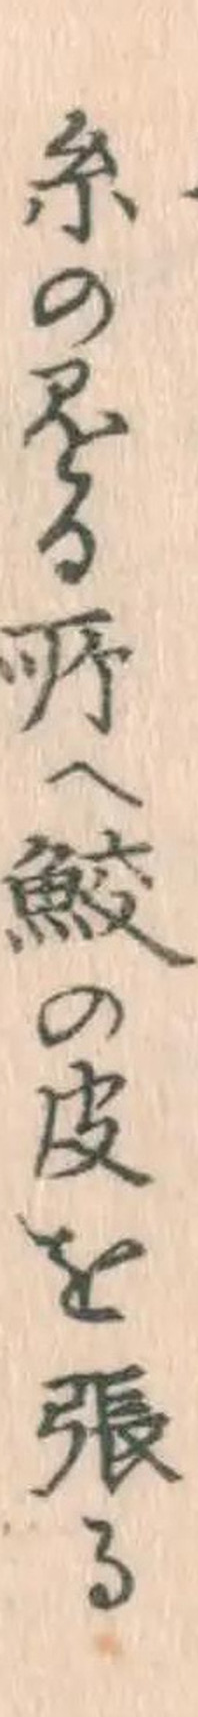糸の懸る所へ鮫の皮を張る
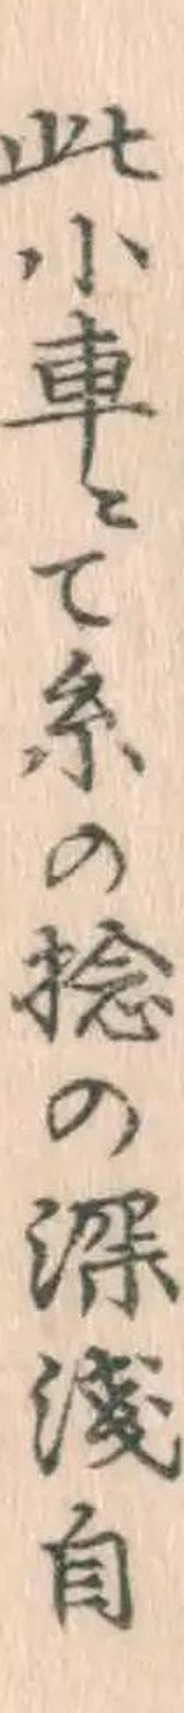此小車にて糸の捻の深浅自
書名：機織彙編 5巻. [1]
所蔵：国立国会図書館 National Diet Library, JAPAN
